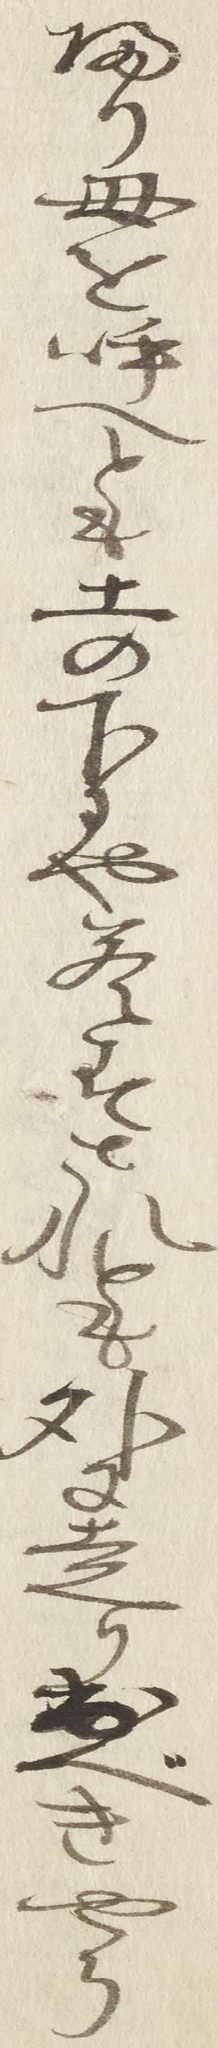帰り母を呼へとも土の下にや答すされとも外に走り出べきやう
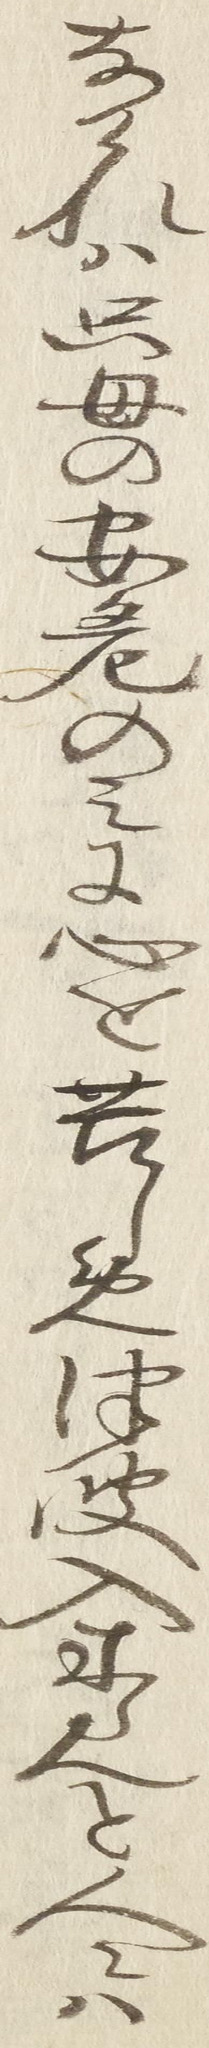なけれは只母の安危のみに心を苦しめ津波来らんと人には
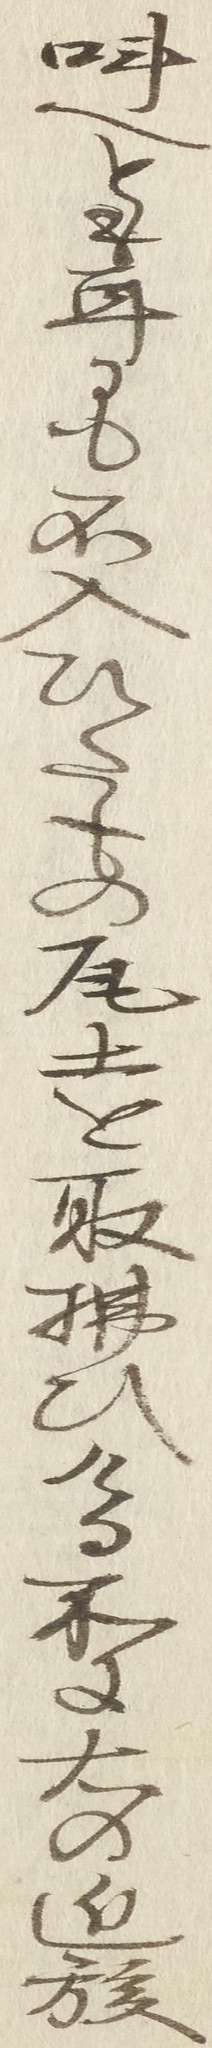叫へとも耳にも不入ひたもの瓦土を取払ひける所に右の近族
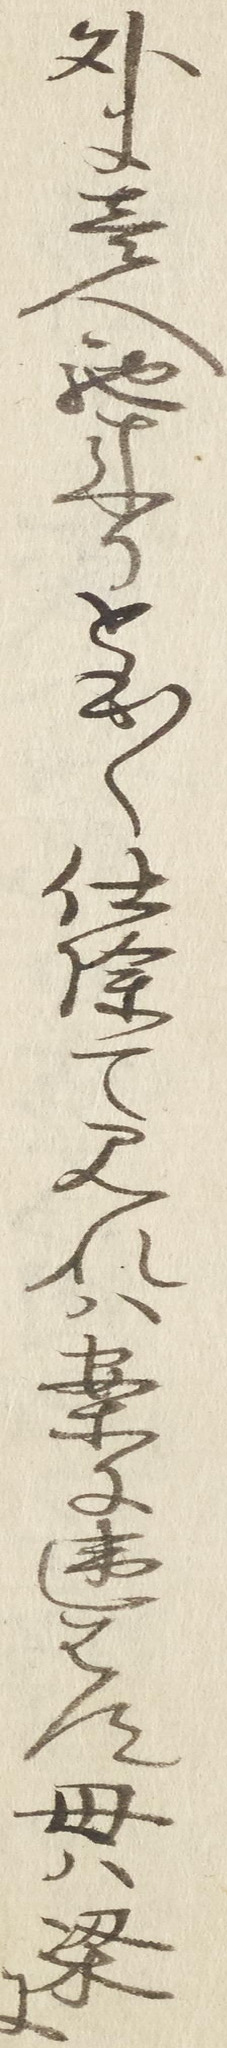外に壱人馳来りとも〳〵仕除て見れは案に違わす母は梁に
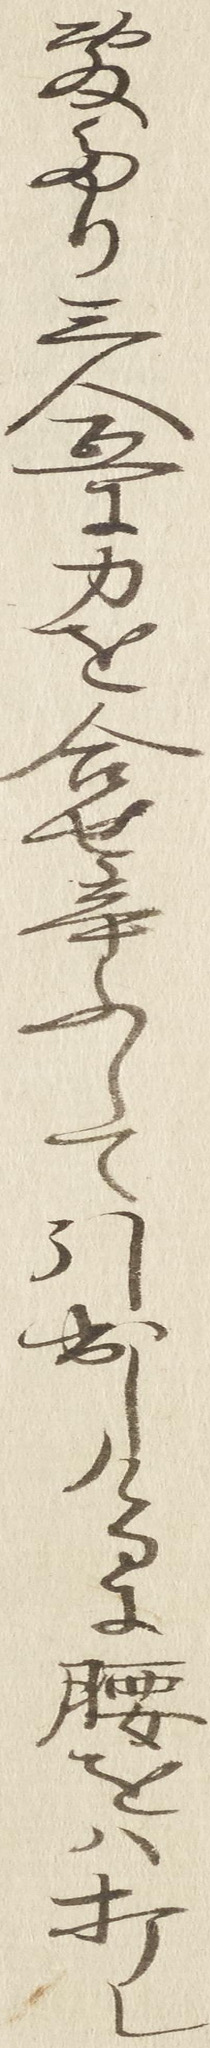敷たり三人互に力を合せ辛ふして引出しけるに腰をは打れ
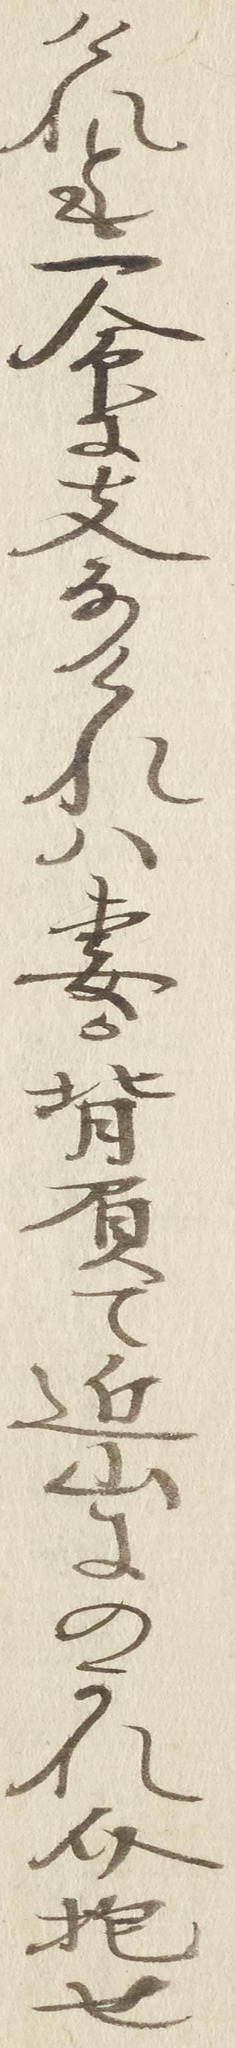けれとも一命に支なけれは妻か背負て近山にのかれ介抱せ
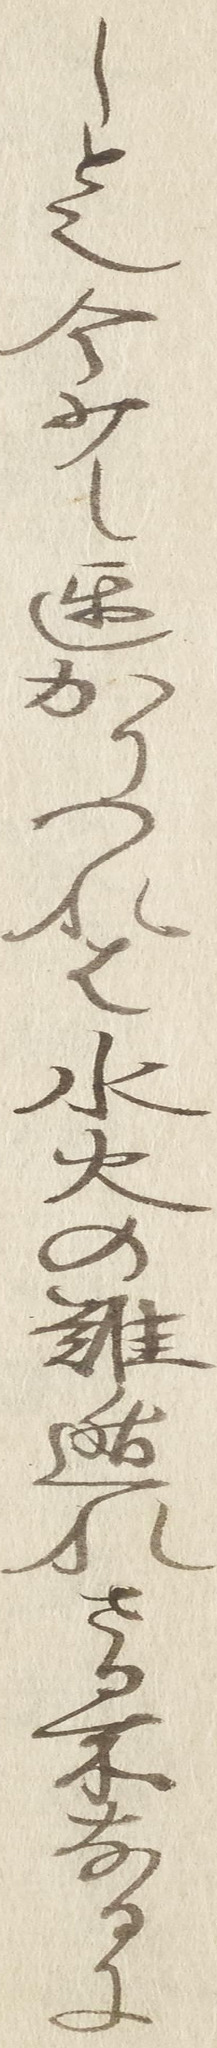しと也今少し遅かりつれは水火の難遁れさる所なるに
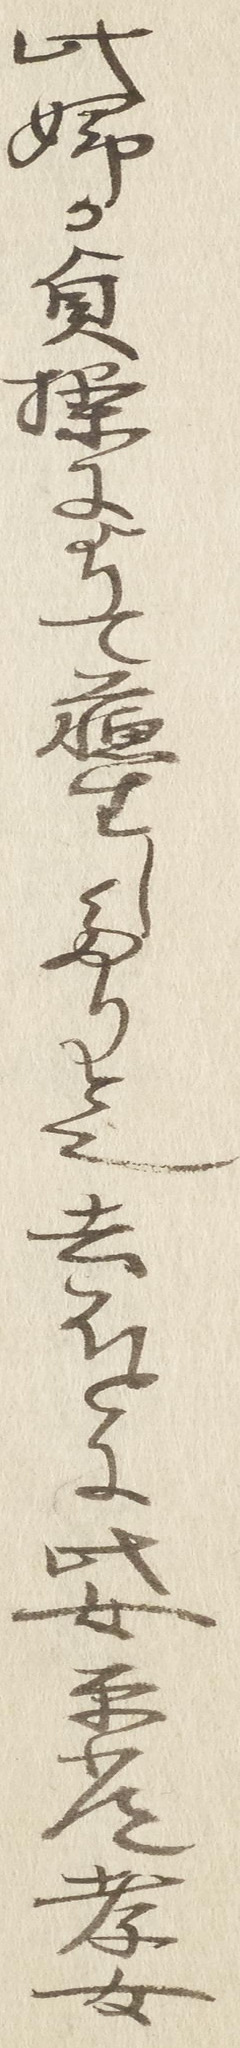此婦か貞操によりて蘇生したりと也去ほとに此女平常孝女
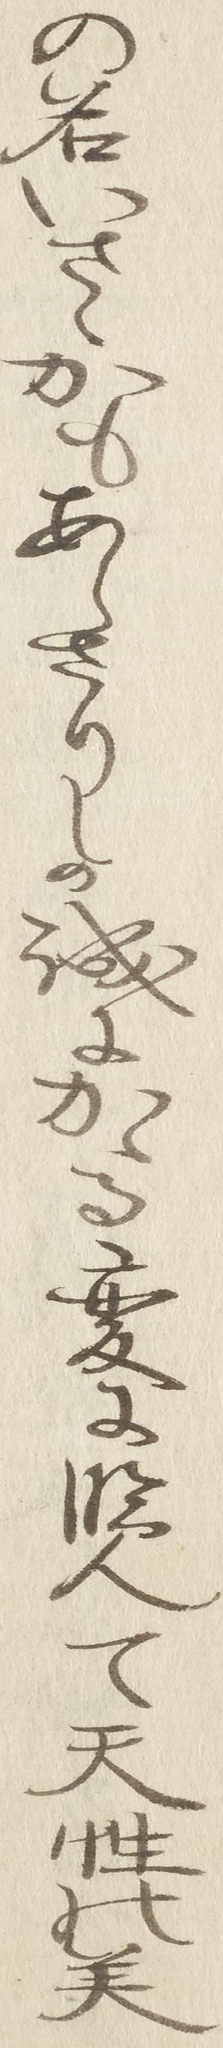の為いさゝかもあらさりしの誠にかる変に臨んて天性の美
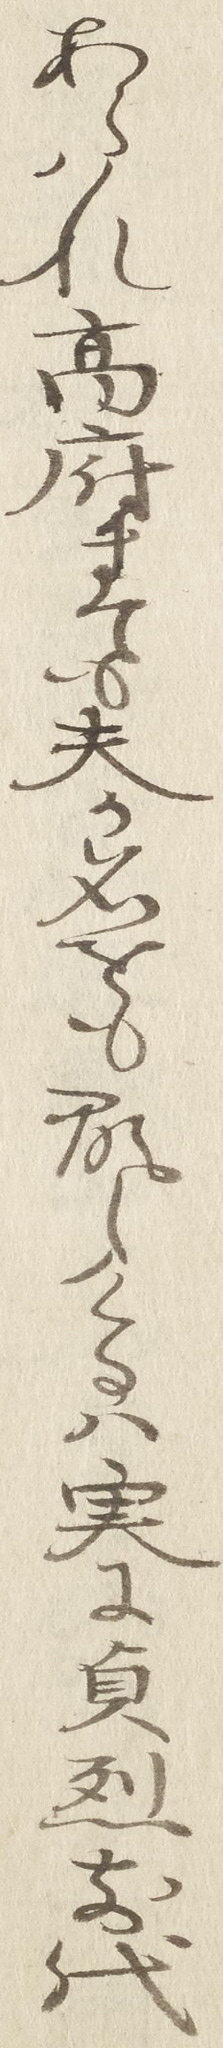あらはれ高府まても夫か名をも顕しけるは実に貞烈前代
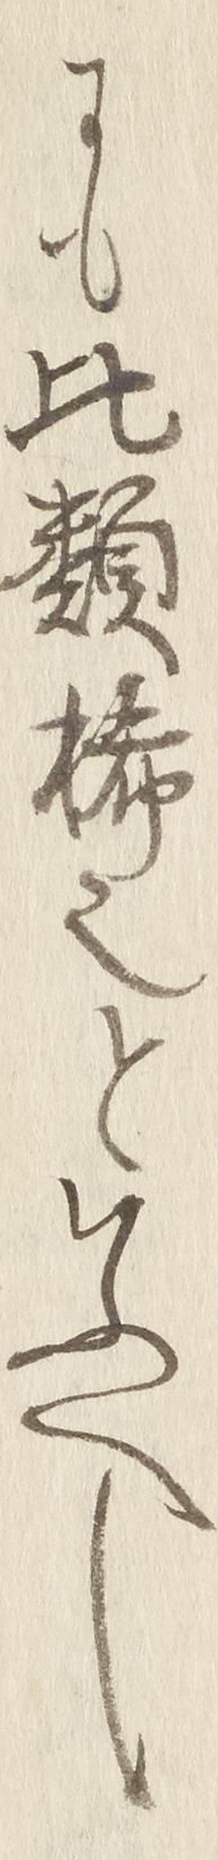にも比類稀也といふへし

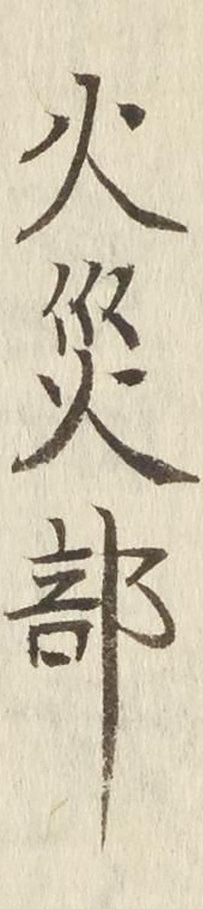火災部
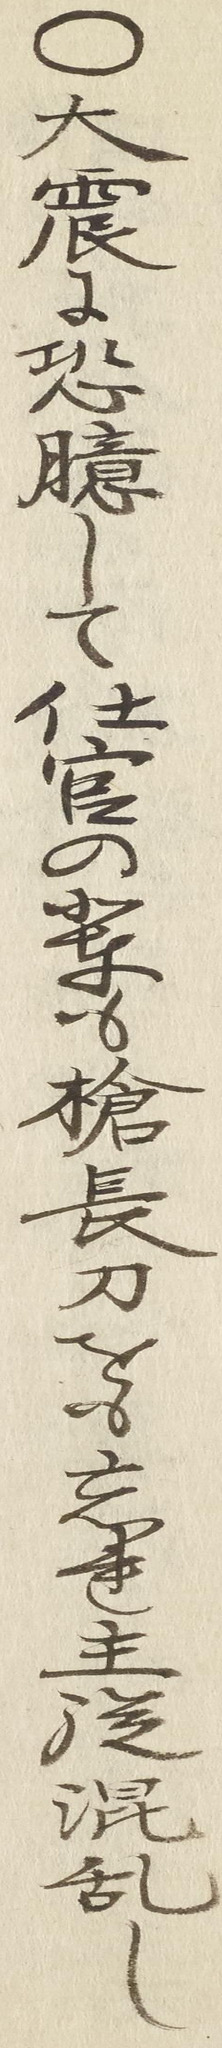○大震に恐臆して仕官の輩も槍長刀をも忘れ主従混乱し
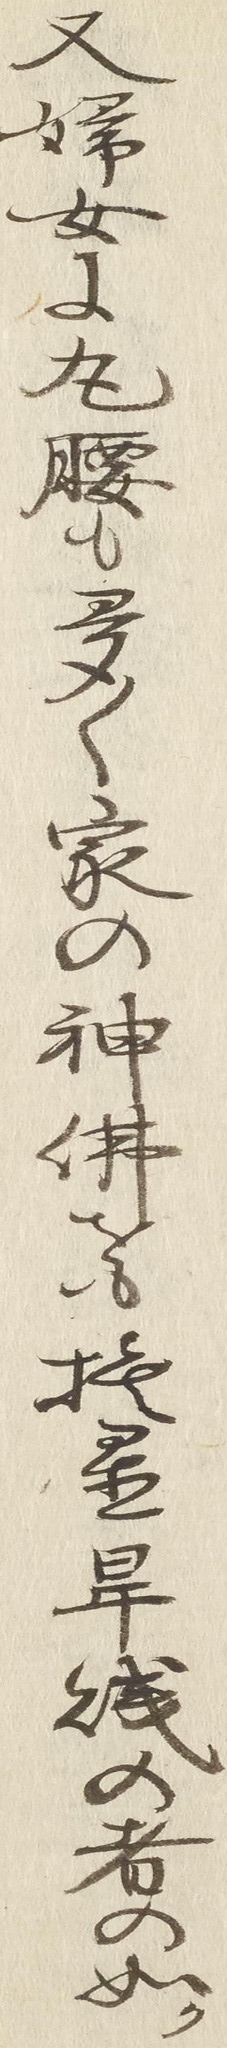又婦女に丸腰も多く家の神仏をも捨置卑賤の者の如ク
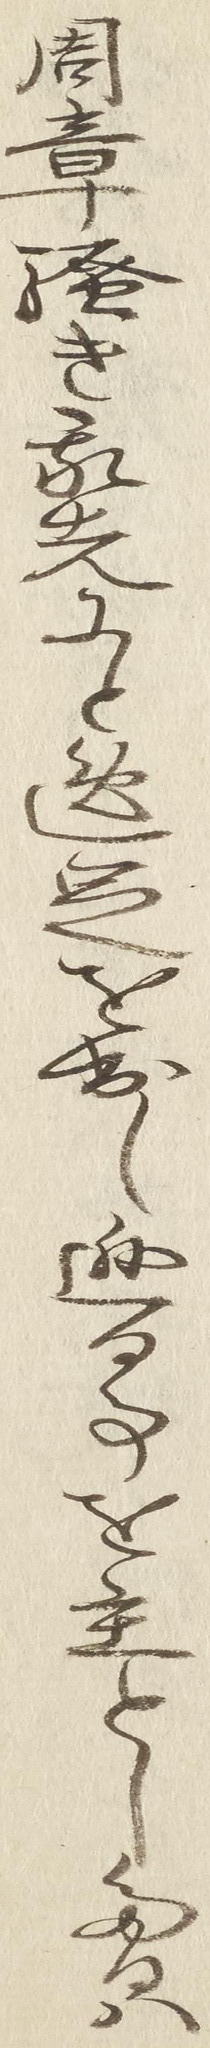周章騒き我先にと逸足を出し逃る事を主としたるハ
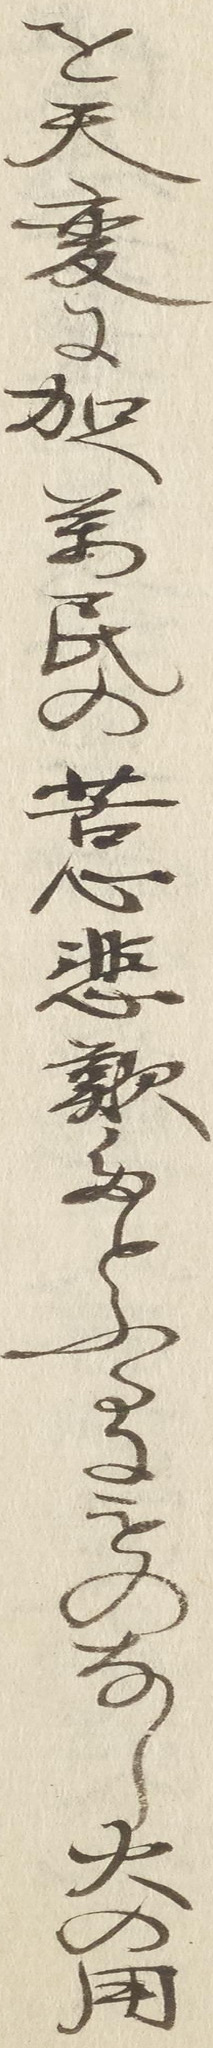いかにそや故万民の苦心悲歎たとふるにものなし火の用
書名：地震記　上
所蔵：東京大学地震研究所図書室 Earthquake Research Institute Library, The University of Tokyo, JAPAN
